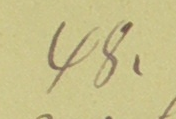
48
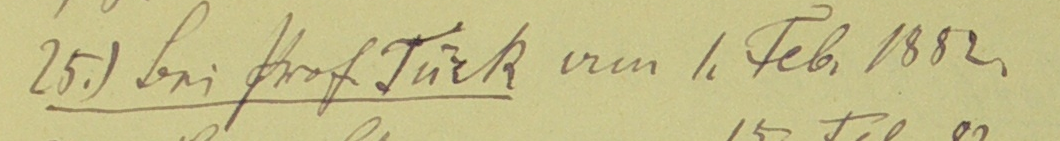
25.) Bei Prof. Türk am 1. Febr. 82
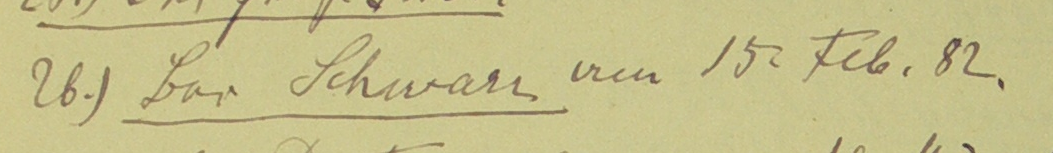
26.) Bei Schwarz am 15. Febr. 82
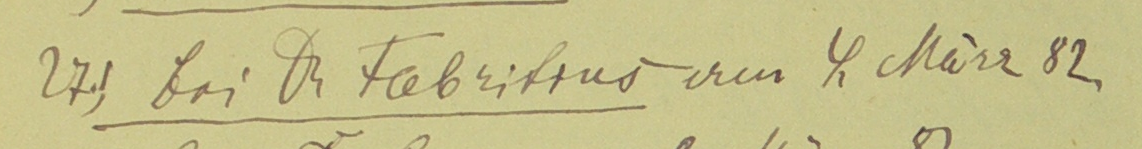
27.) Bei Dr. Fabritius am 4. März 82
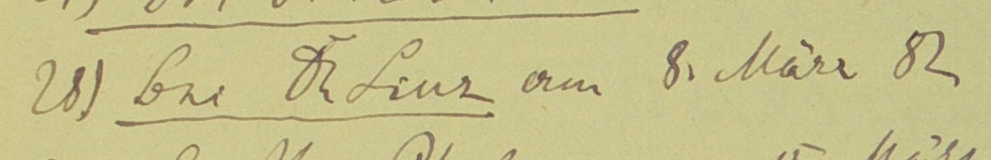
28.) Bei Dr. Linz am 8. März 82
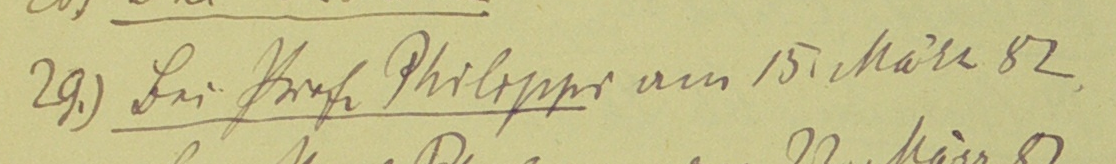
29.) Bei Prof. Philippi am 15. März 82
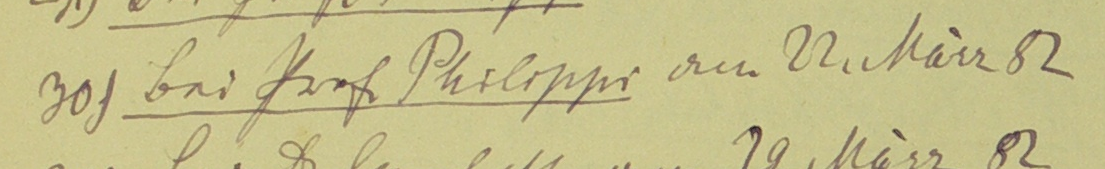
30.) Bei Prof. Philippi am 22. März 82
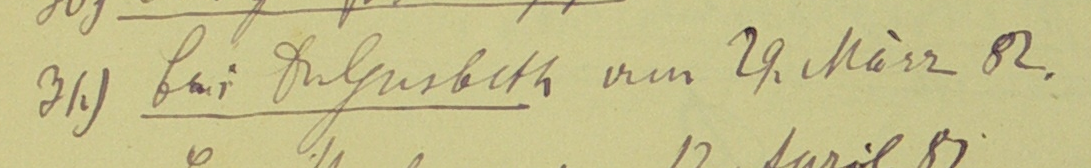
31.) Bei Dr. Gusbeth am 29. März 82
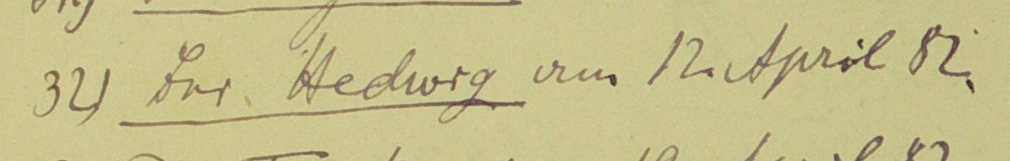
32.) Bei Hedwig am 12. April 82
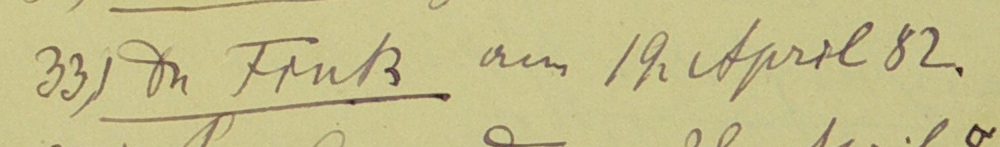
33.) Dr. Fink am 19. April 82
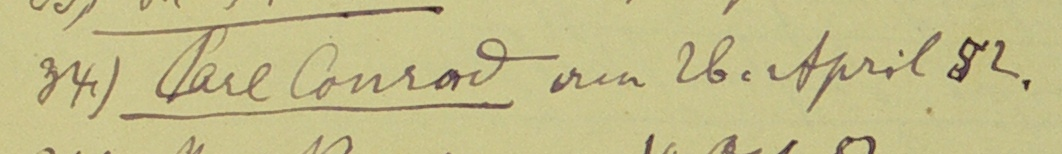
34.) Carl Conrad am 26. April 82
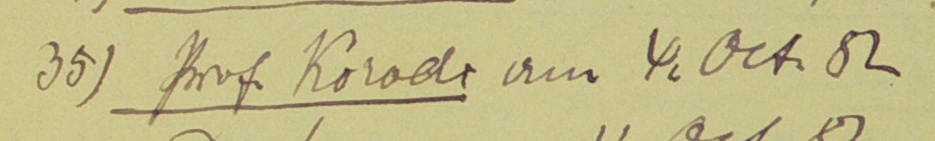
35.) Prof. Korodi am 4. Octob. 82
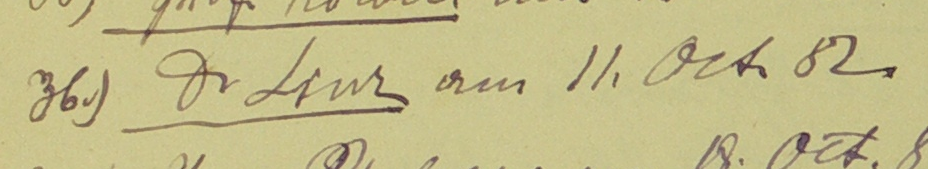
36.) Dr. Linz am 11.Octob.82
